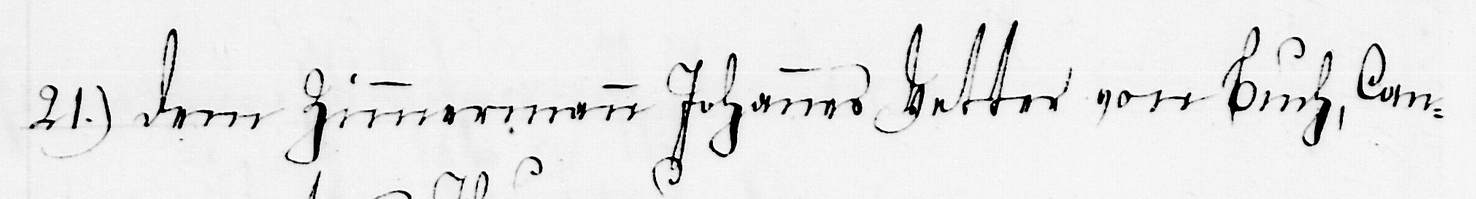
21.) dem Zimmermann Johannes Vetter von Buch, Can¬
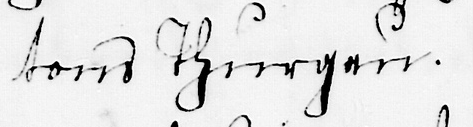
tons Thurgau.
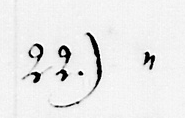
22.)
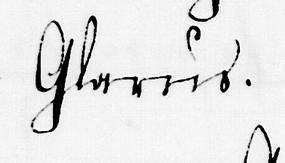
Glarus.
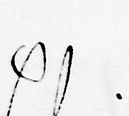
23.)
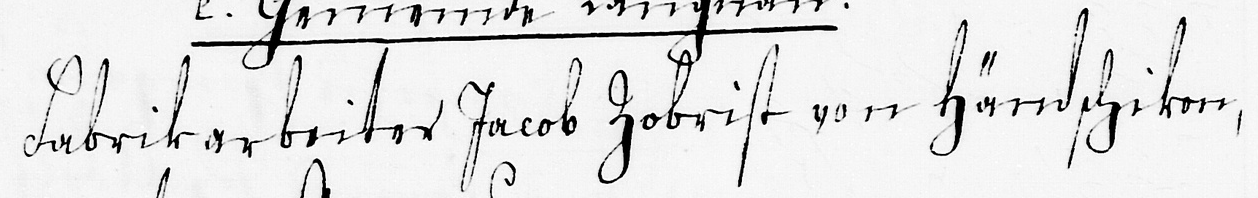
abrikarbeiter Jacob Zobrist von Händschikon,
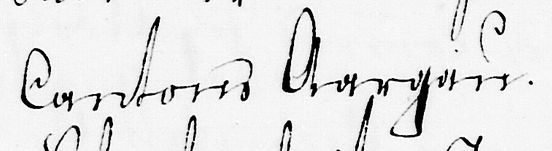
Cantons Aargau.
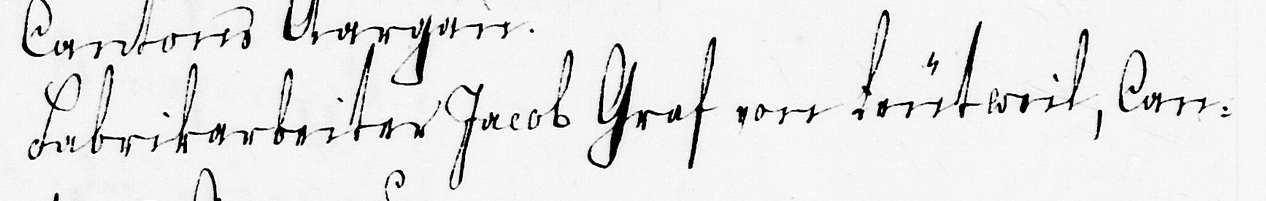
abrikarbeiter Jacob Graf von Leutweil, Can¬
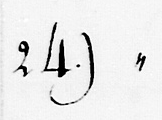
24.)
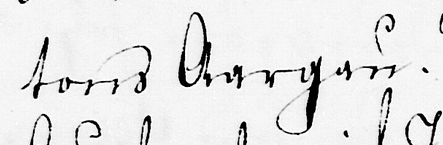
tons Aargau.
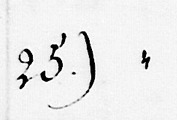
25.)
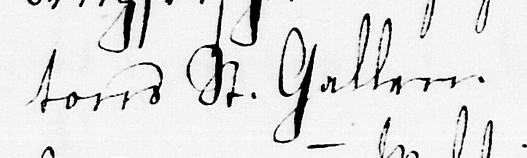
tons St. Gallen.
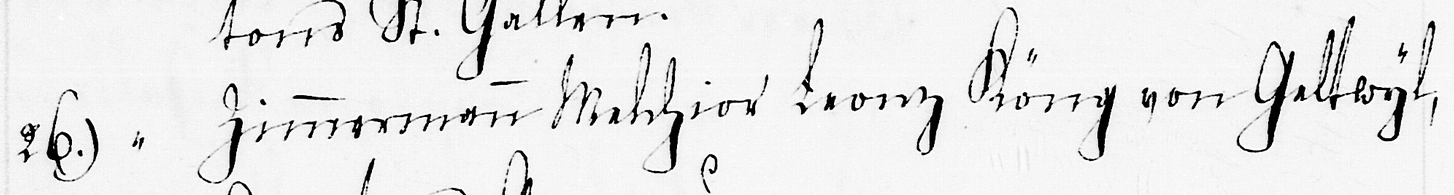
26.) “ Zimmermann Melchior Leonz Köng von Geltwyl,
